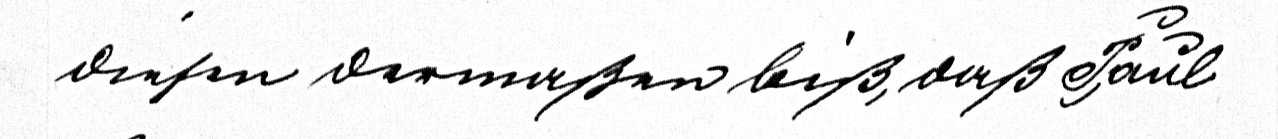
diesen dermaßen biß, daß Paul
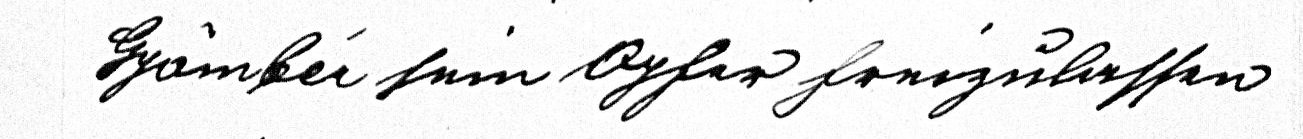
Gyömbér sein Opfer freizulassen
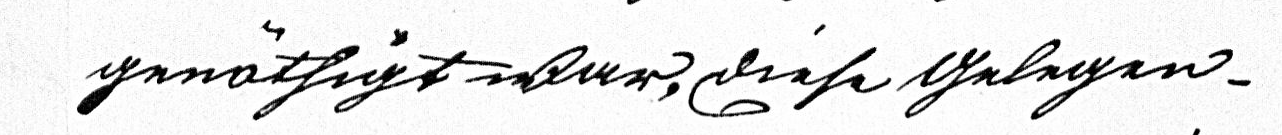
genöthigt war, diese Gelegen¬
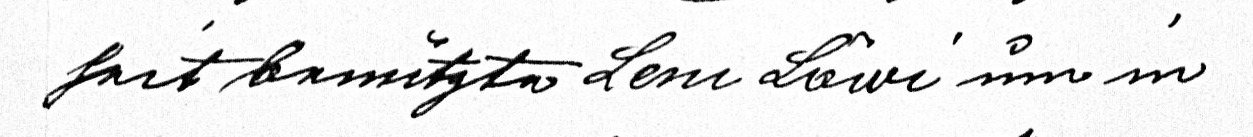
heit benützte Lem Löwi um in
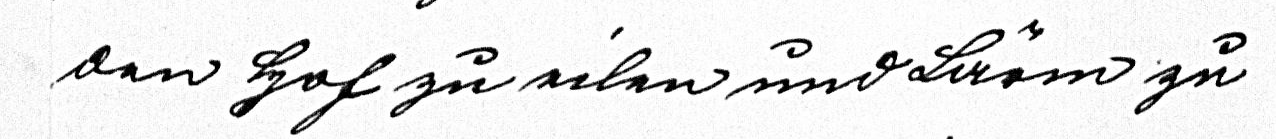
den Hof zu eilen und Lärm zu
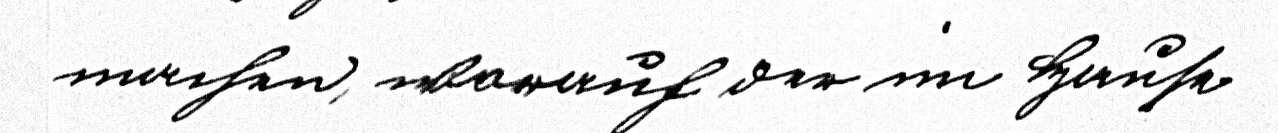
machen, worauf der im Hause
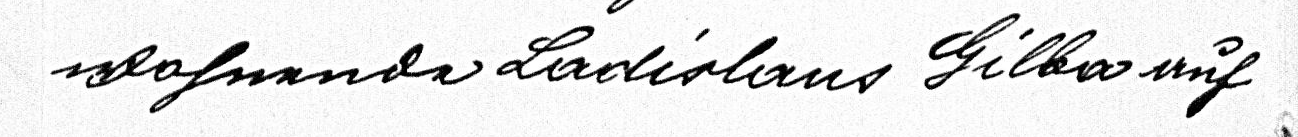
wohnende Ladislaus Gilba auf
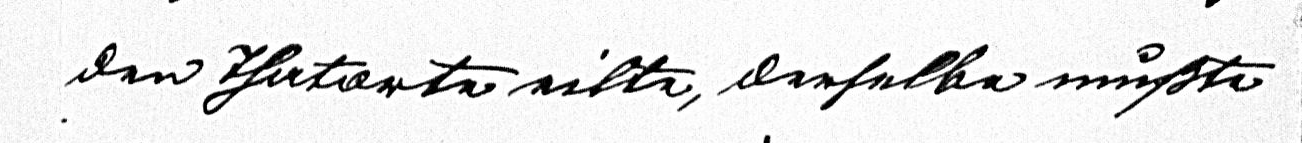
den Thatorte eilte, derselbe mußte
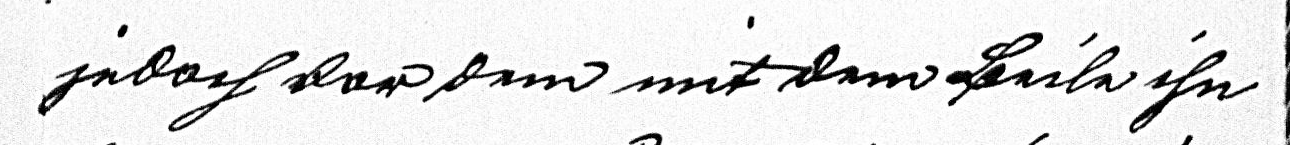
jedoch vor dem mit dem Beile ihn
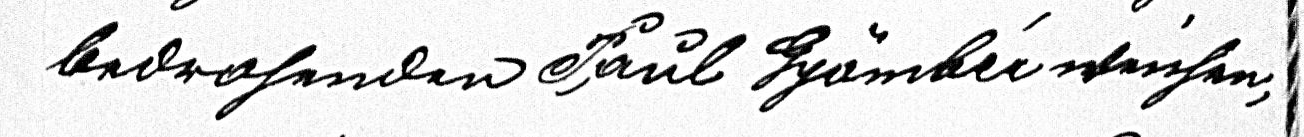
bedrohenden Paul Gyömbér weichen,
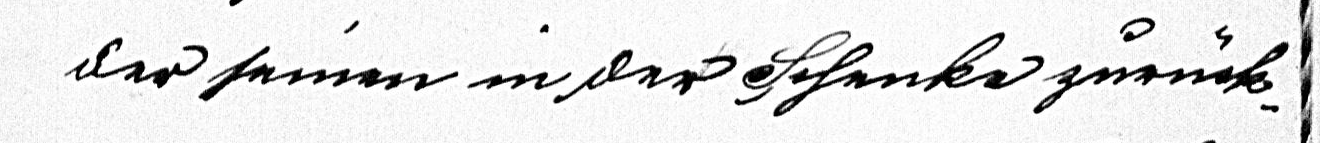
der seinen in der Schenke zurück
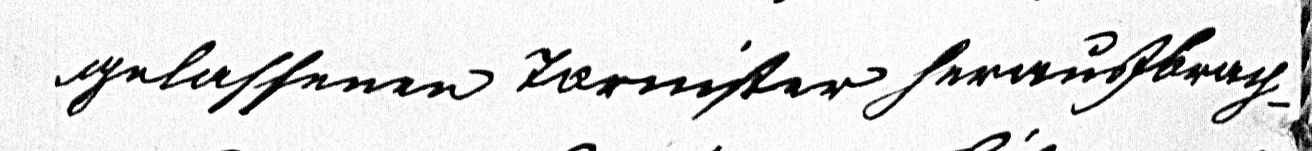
gelassenen Tornister herausbrach¬
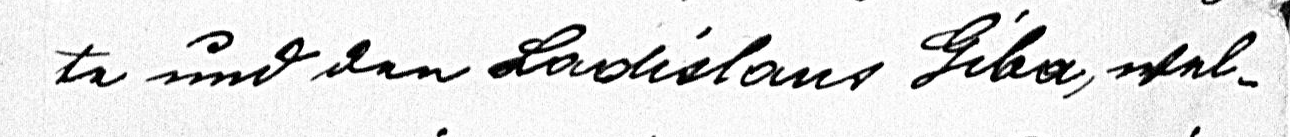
te und den Ladislaus Giba, wel¬
